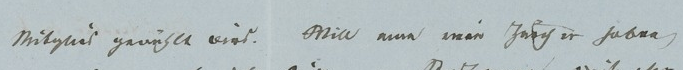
Mitglied gewählt wird. Will man einen Zürcher haben,
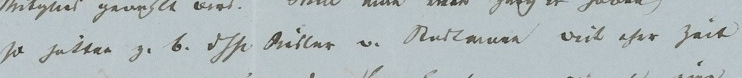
so hätten z. B. d Hhr Siedler &. Stadtmann weit eher Zeit
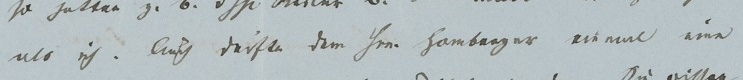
als ich. Auch dürfte dem Hrn. Homberger einmal eine
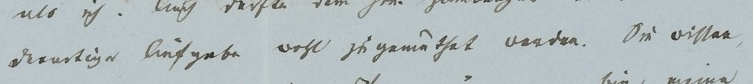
derartige Aufgabe wohl zugemuthet werden. Sie wissen,
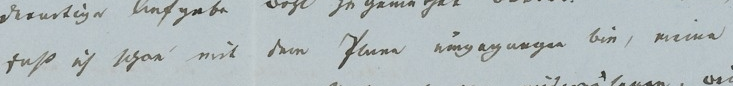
dass ich schon mit dem Plane umgegangen bin, meine
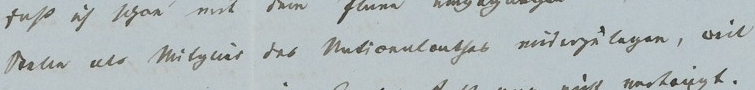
Stelle als Mitglied des Nationalrathes niederzulegen, weil
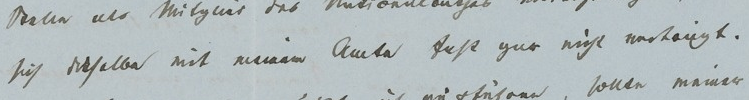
sich dieselbe mit meinem Amte fast gar nicht verträgt.
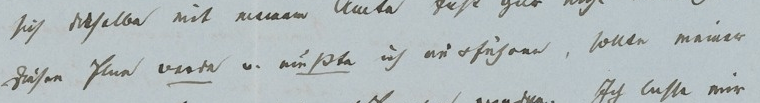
Diesen Plan werde &. müßte ich ausführen, sollte meiner
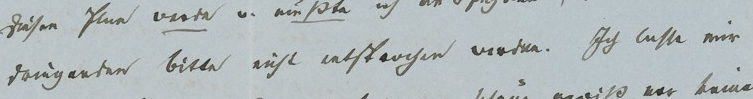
dringenden Bitte nicht entsprochen werden. Ich lasse mir
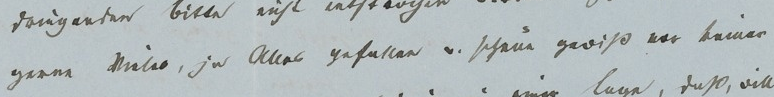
gerne Vieles, ja Alles gefallen &. scheue gewiß vor keiner
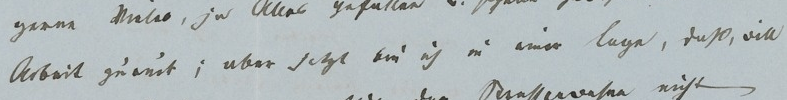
Arbeit zurück; aber jetzt bin ich in einer Lage, daß, will
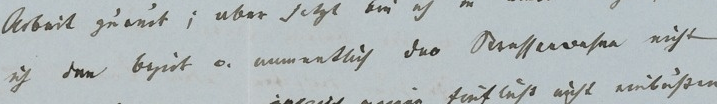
ich den Bezirk &. namentlich das Strassenwesen nicht
